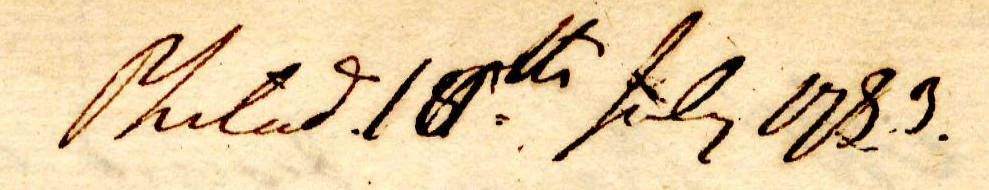Philad 18^th. July 1783.
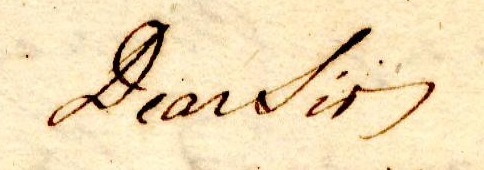Dear Sir
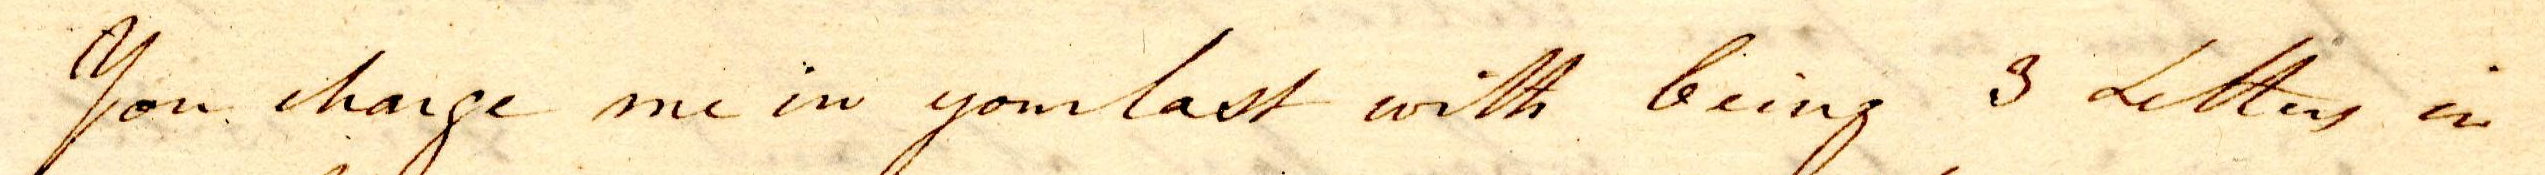You charge me in your last with being 3 Letters in
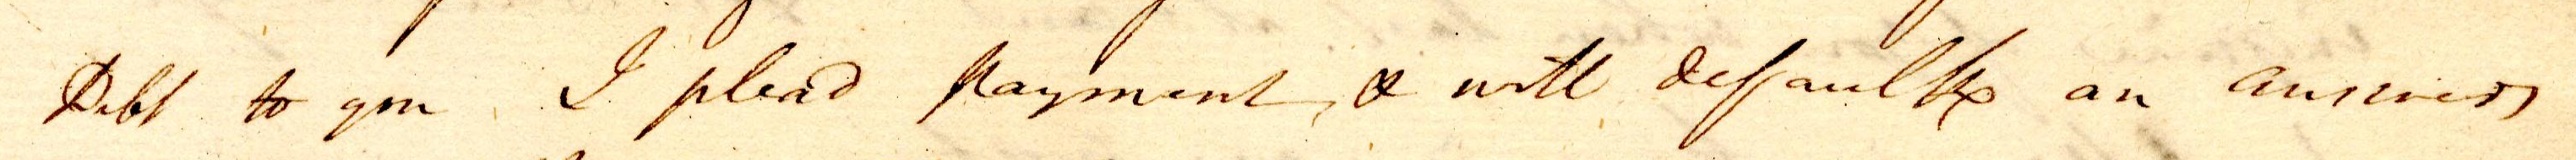Debt to you. I plead payment & will Default an answer
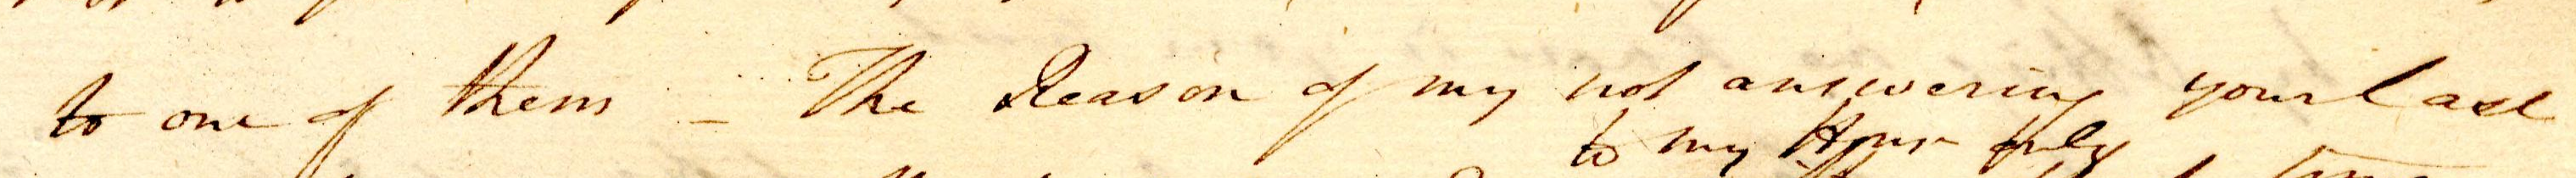to one of them. The Reason of my not answering your last
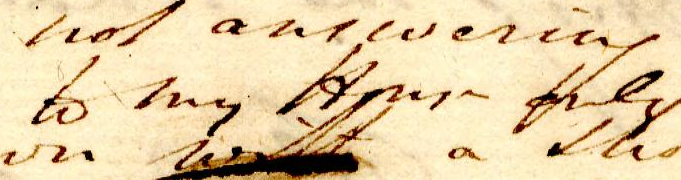to my Ans fuly
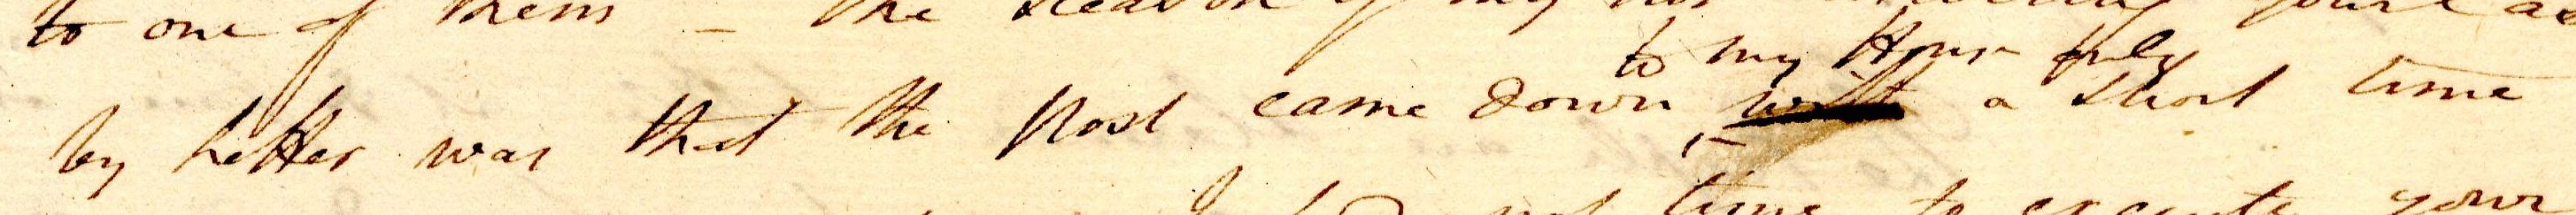by Letter was that the Post came down ^ with a short time
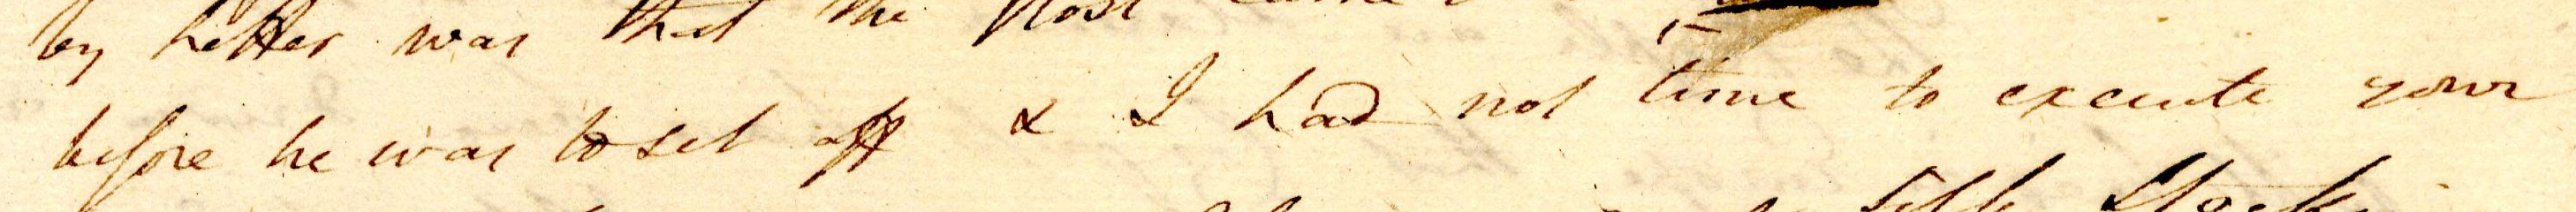before he was to set off & I had not time to excite your
